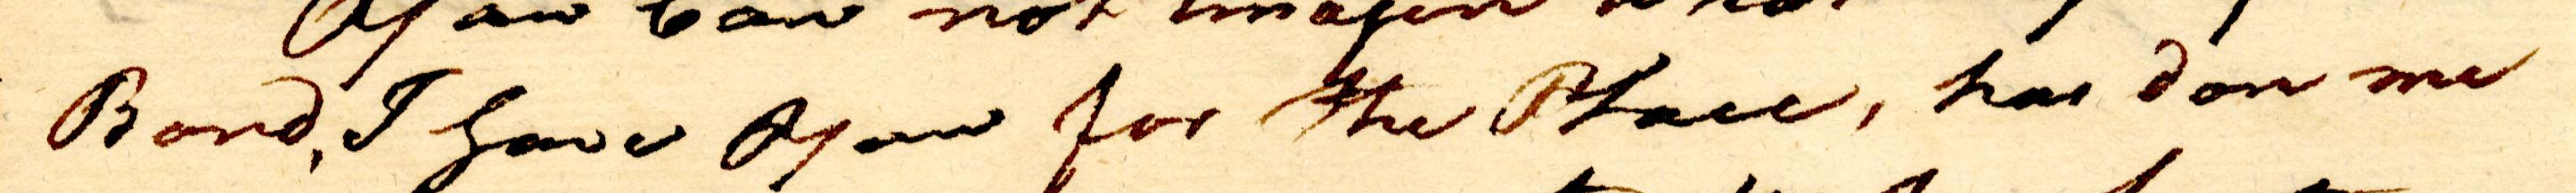Bond, I gave you for the place, has don me
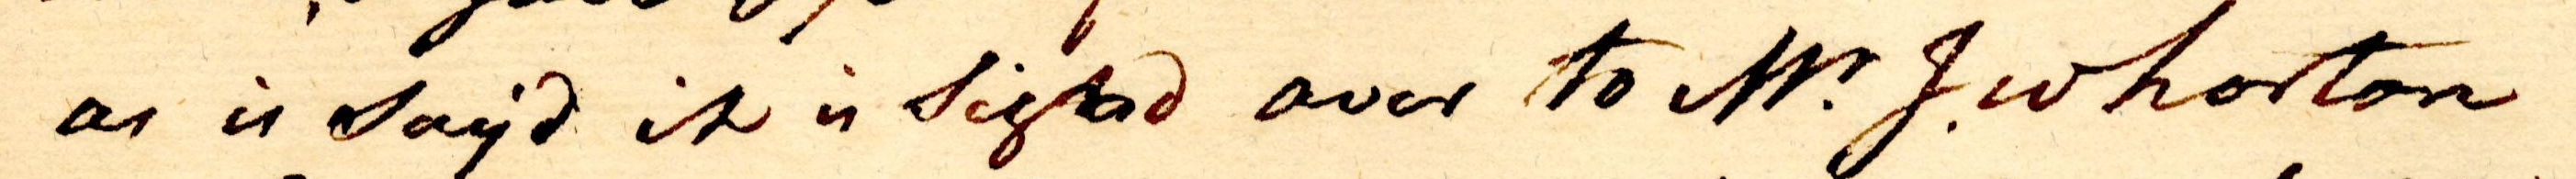as is say'd it is signed over to M^r. J. Whorton
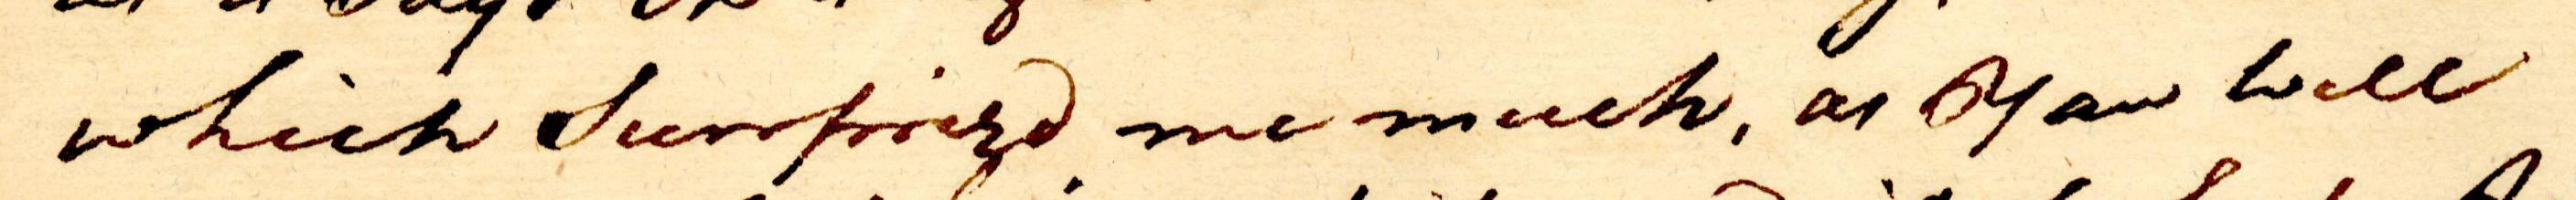which surprrizd me much, as you well
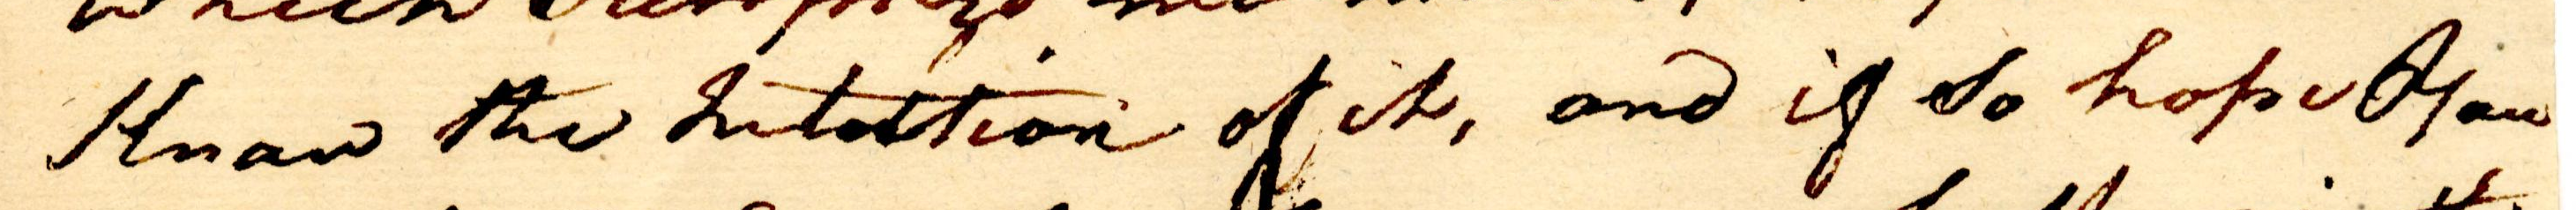know the batallion of it, and if so hope you
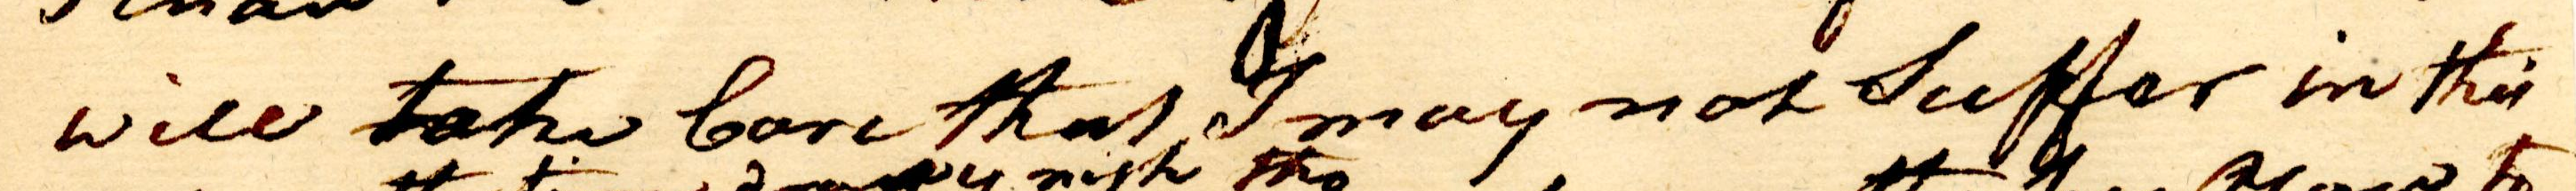will take care that I may not suffer in this
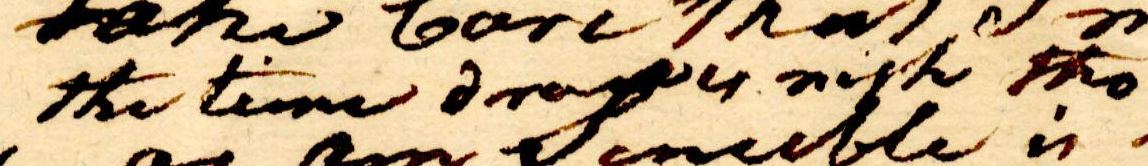the times drages nigh tho
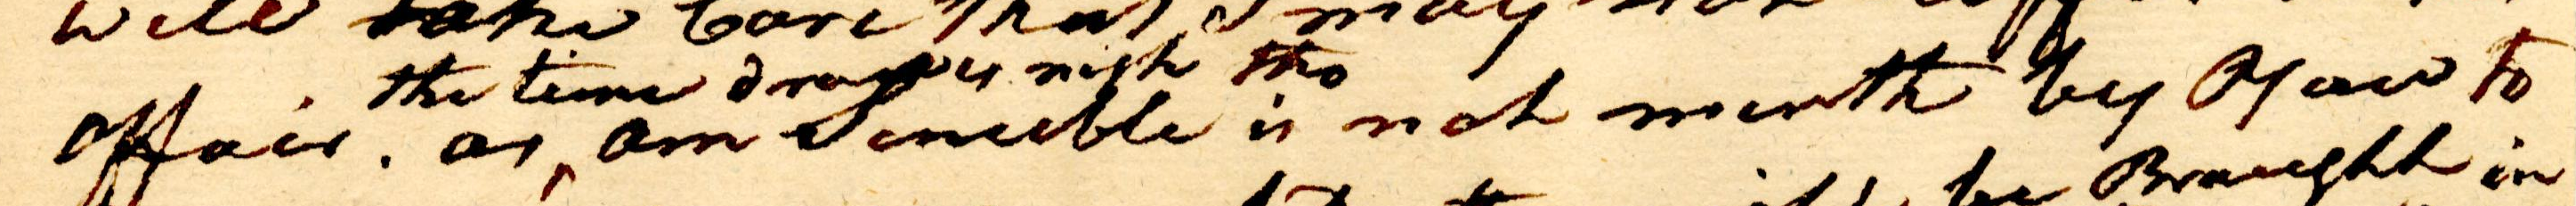affair as ^ am senseble id not menth by you to
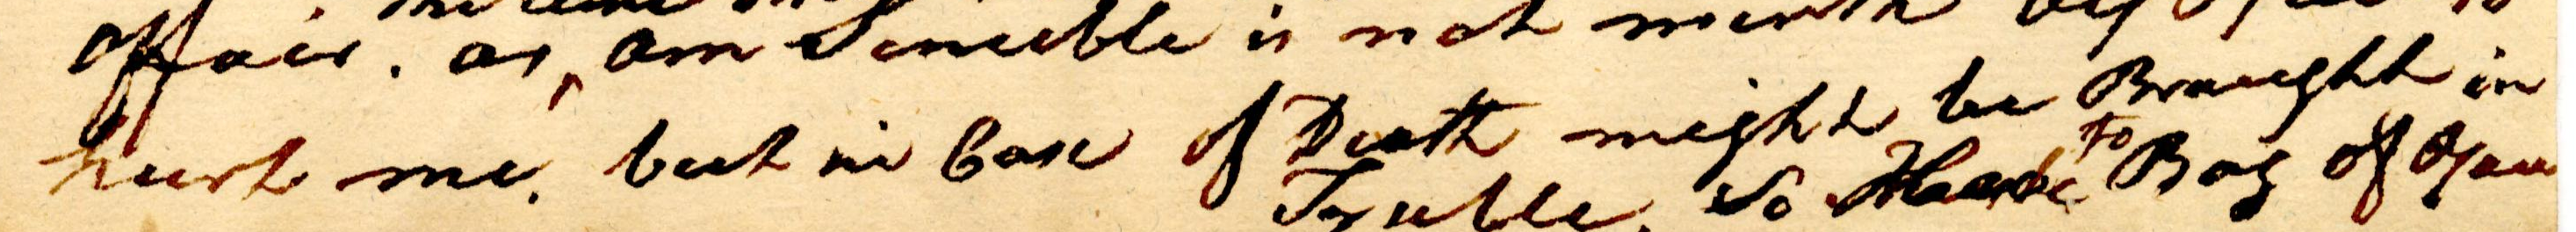hurt me. but in case of Feath might be braught in
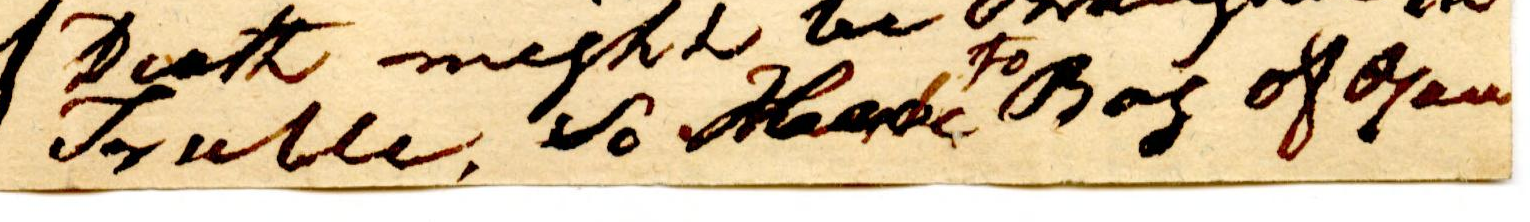Truble, so please to beg of you
